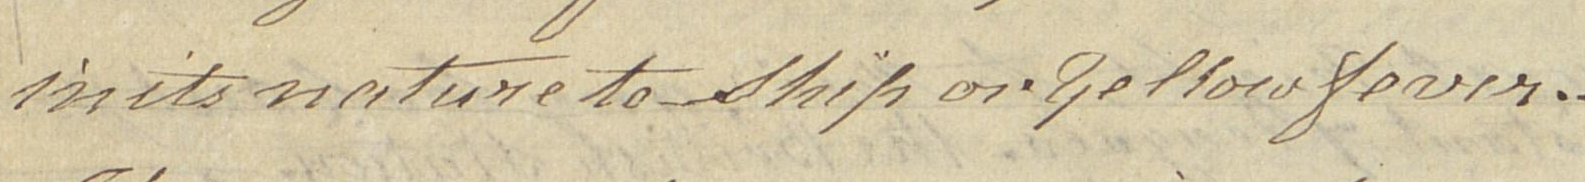in its nature to Ship or Yellow fever.
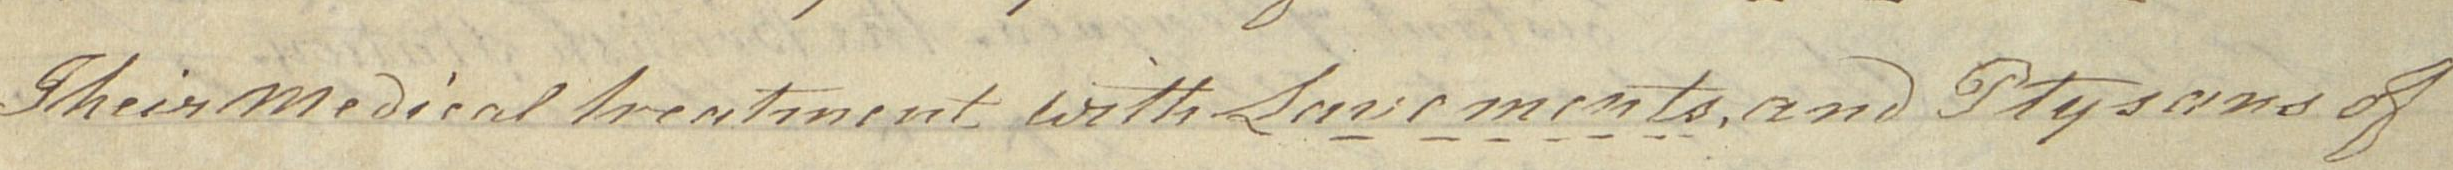Their Medical treatment with Lavements and Ptysans of
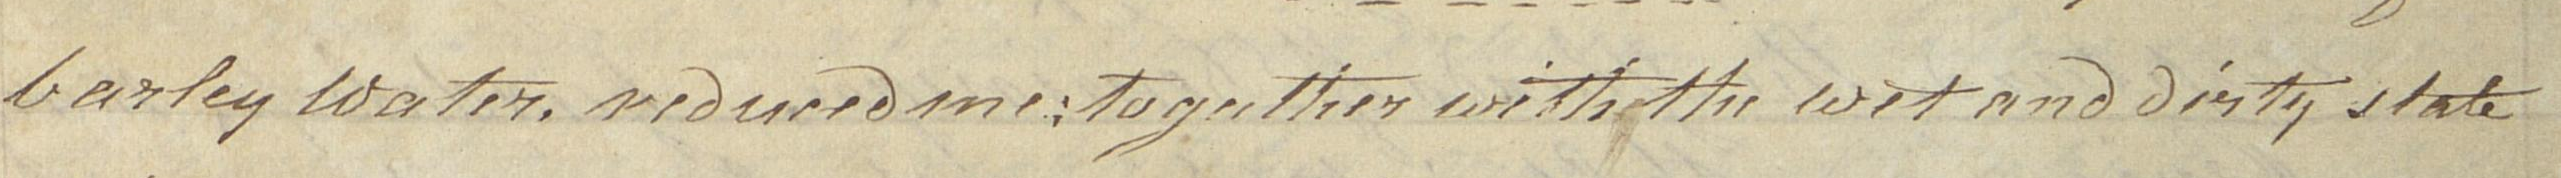barley Water, reduced me: together with the wet and dirty state
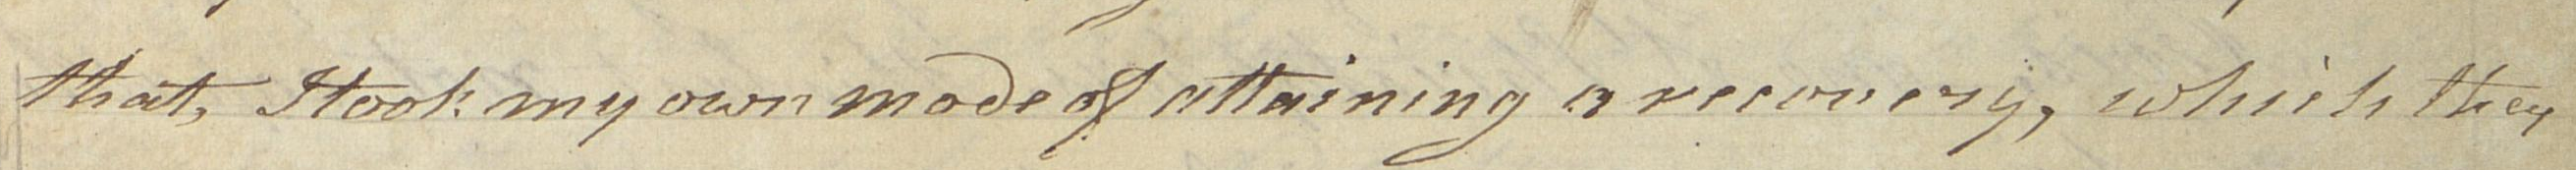that, I took my own mode of attaining a recovery, which they
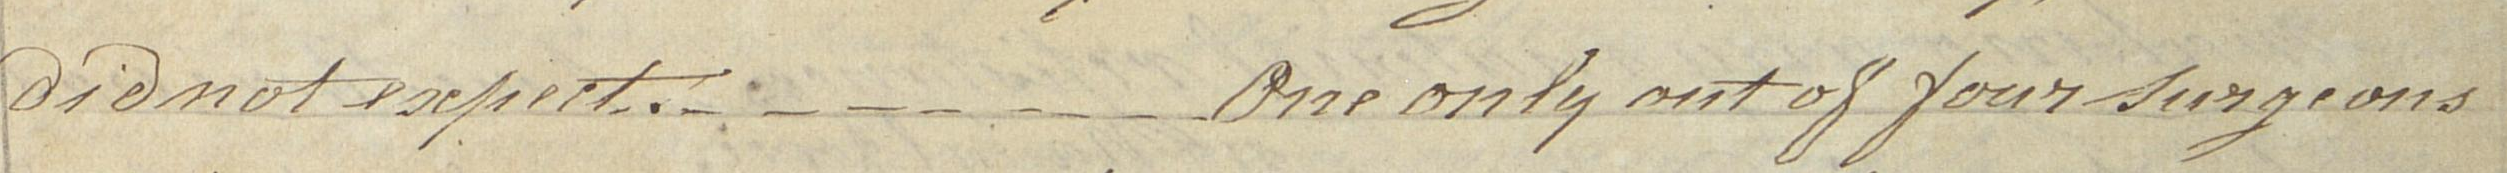did not expect. One only out of four surgeons
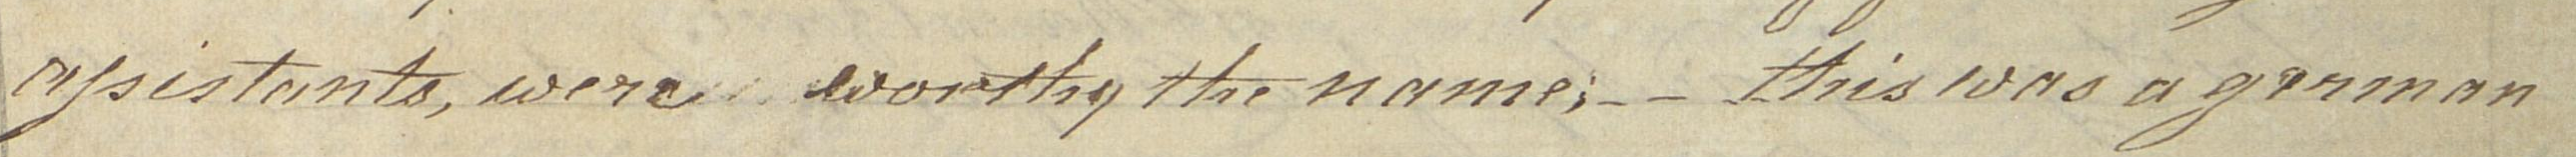Assistants, were worthy the name; this was a german
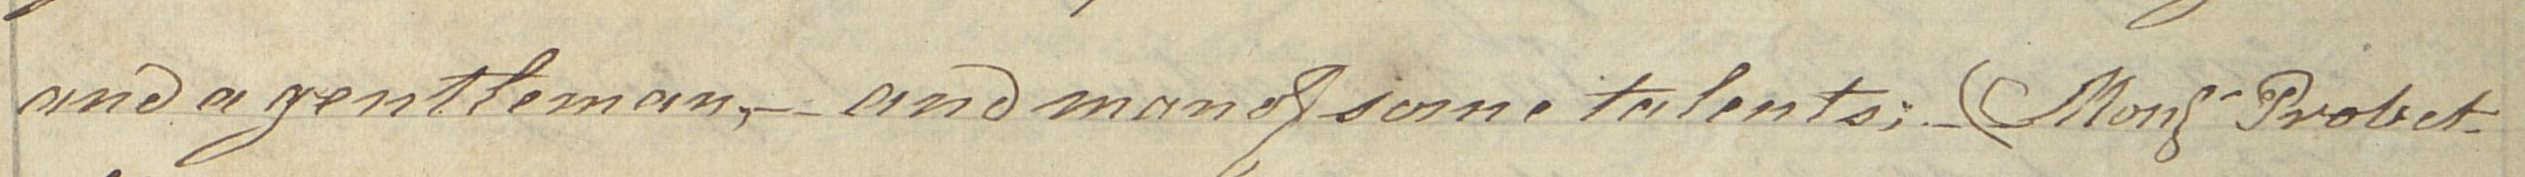and a gentleman, and man of some talents (Mong Probet
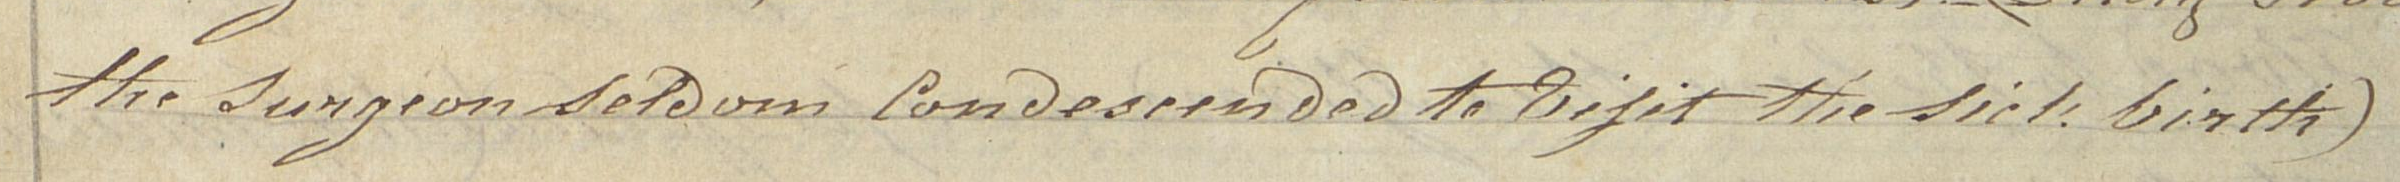the Surgeon seldom Condescended to Visit the Sick birth
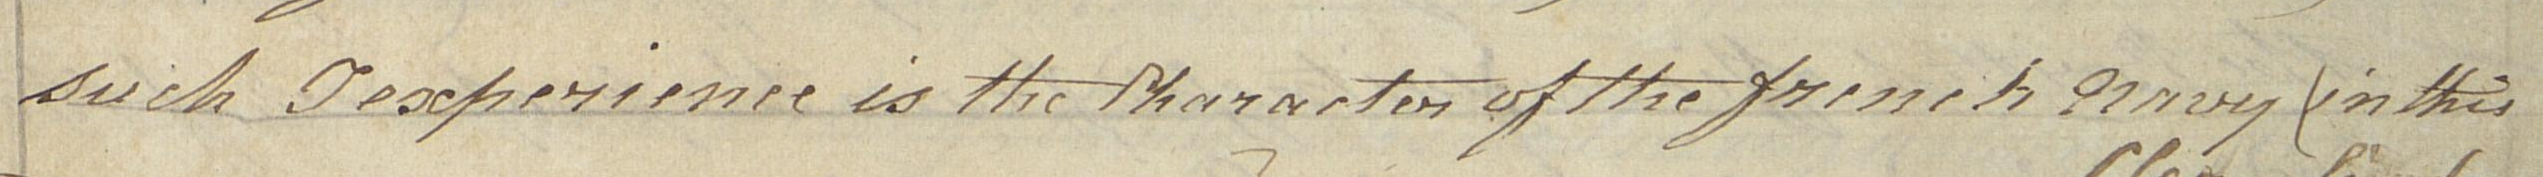such I experience is the Character of the French Navy (in this
